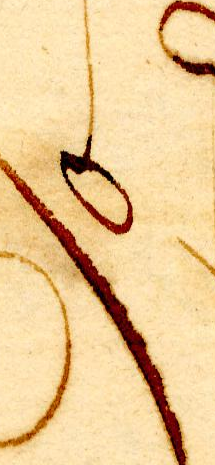To
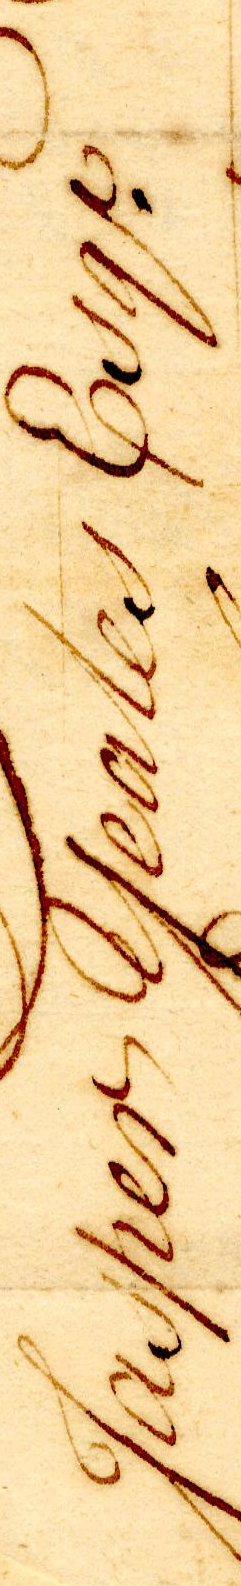Jasper Yeates Esq^r.
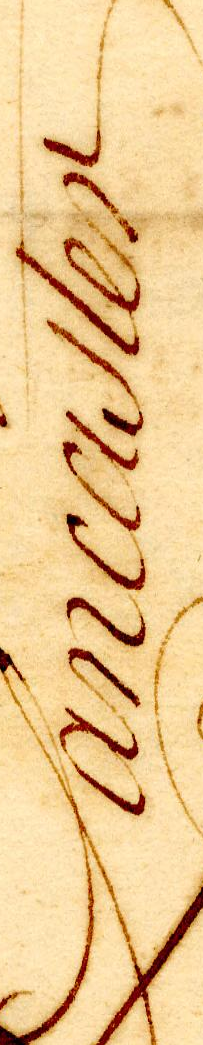Lancaster
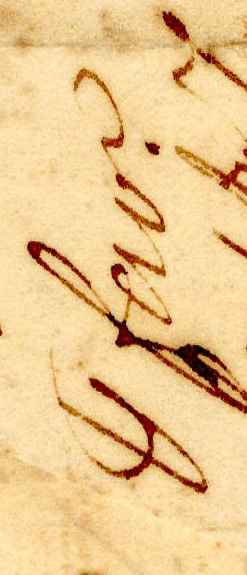Per fav^r
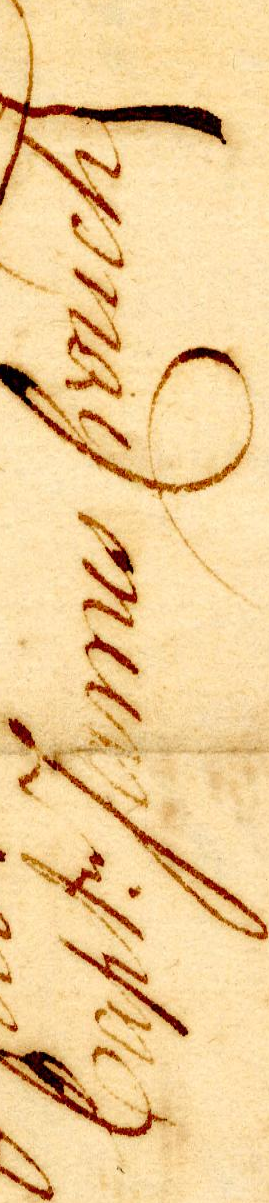Capt^n. James Crouch
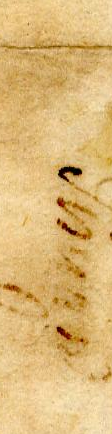Tinian
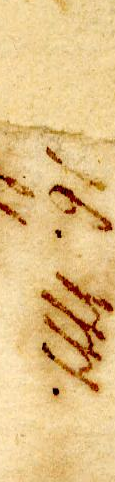16. 1777.
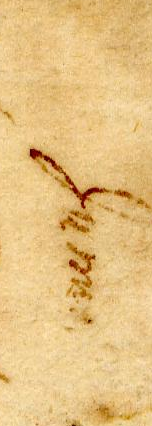James
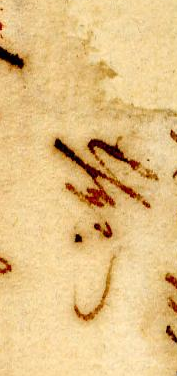Esq^r.
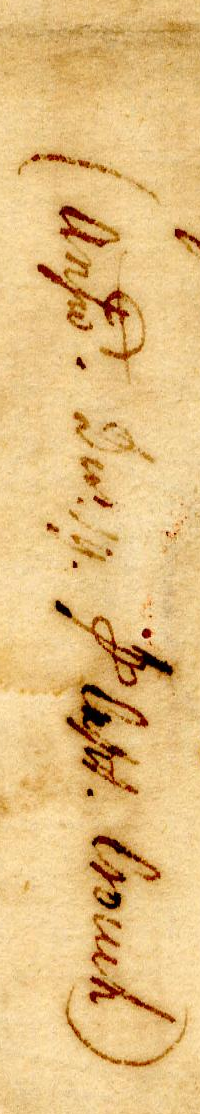(Answ^d. Dec^r. 19. per Capt. Crouch)
